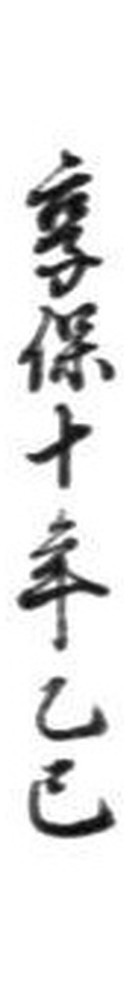享保十年乙巳
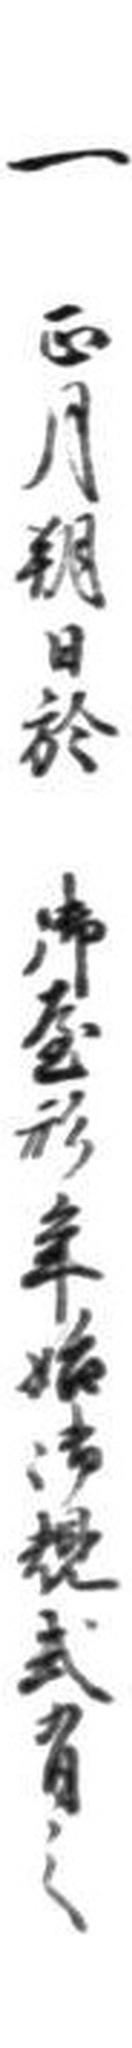一正月朔日於御屋形年始御規式有之
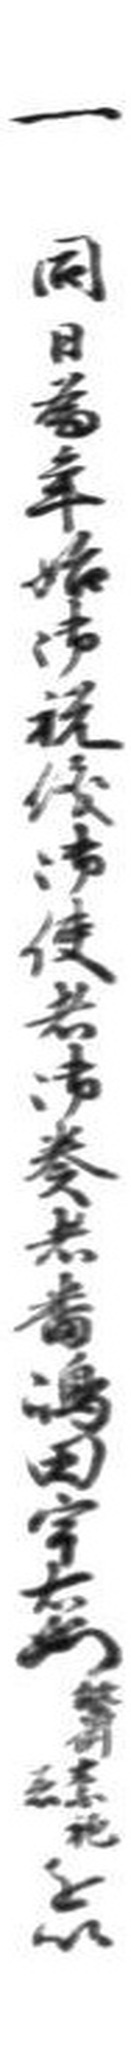一同日為年始御祝儀御使者御奏者番嶋田宇右衛門紋付素袍着を以
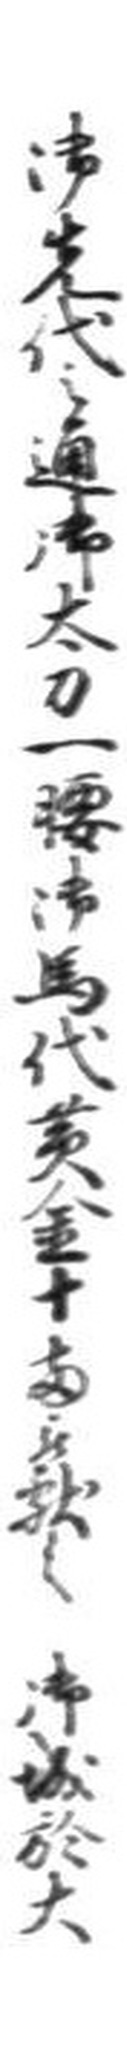御先代之通御太刀一腰御馬代黄金十両被献之御城於大
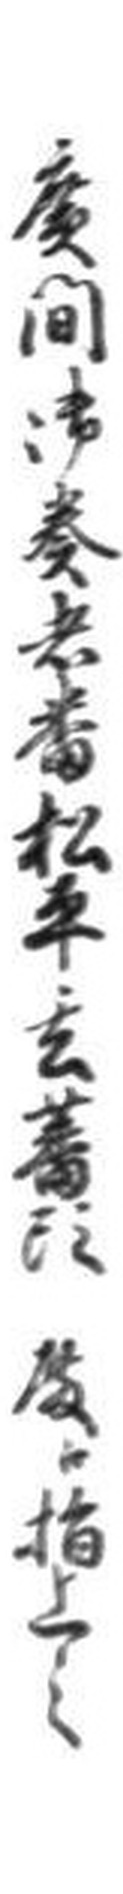広間御奏者番松平玄蕃頭殿江指上之
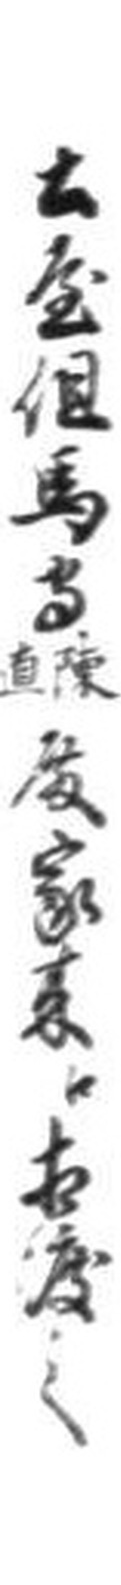土屋但馬守陳直殿家来江相渡之

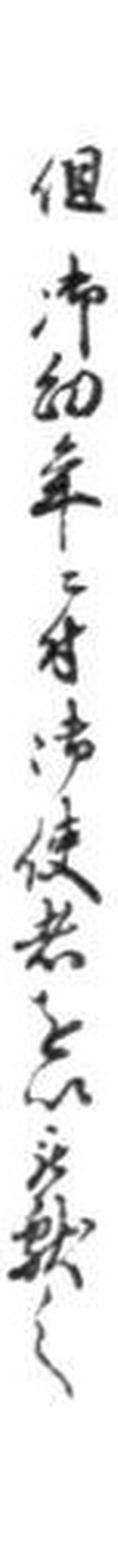但御幼年ニ付御使者を以被献之
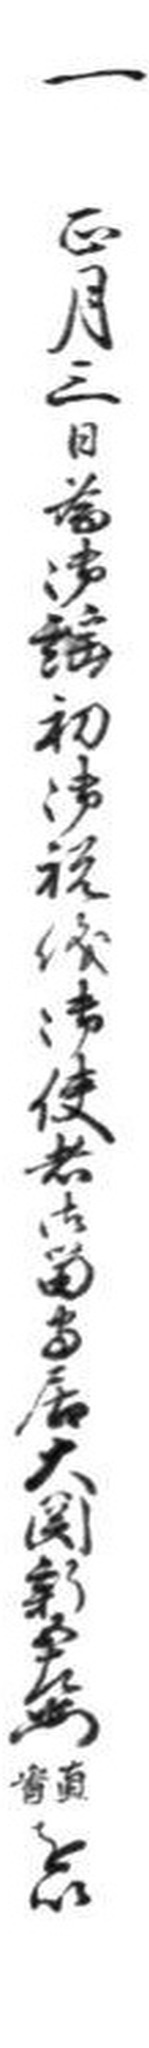一正月三日為御謡初御祝儀御使者御留守居大関新五左衛門直看を以
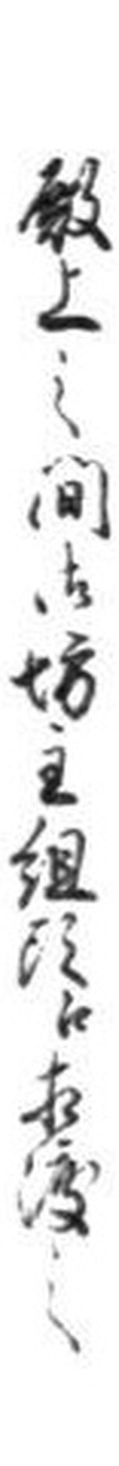殿上之間御坊主組頭江相渡之
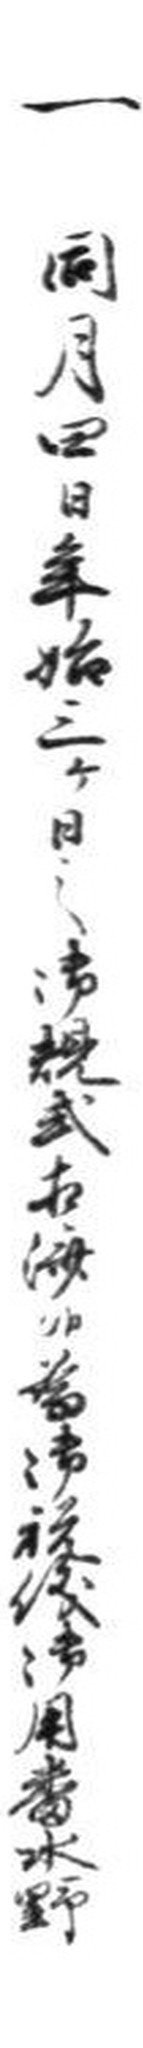一同月四日年始三ヶ日之御規式相済候為御祝儀御用番水野
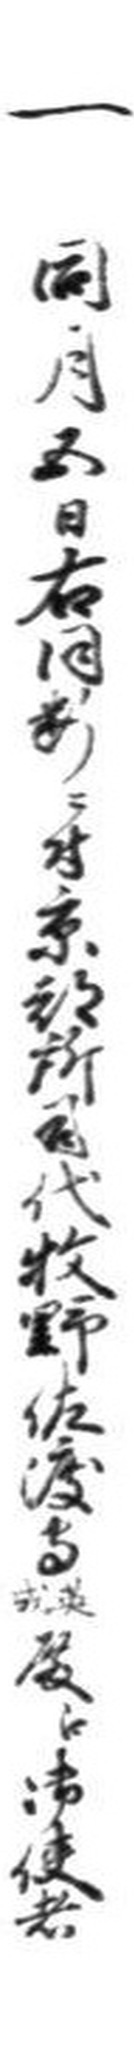一同月五日右同断ニ付京都所司代牧野佐渡守英成殿江御使者
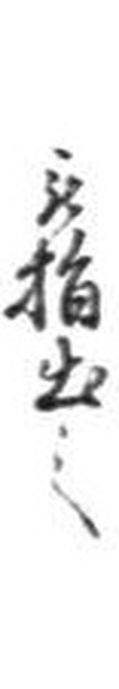被指出之
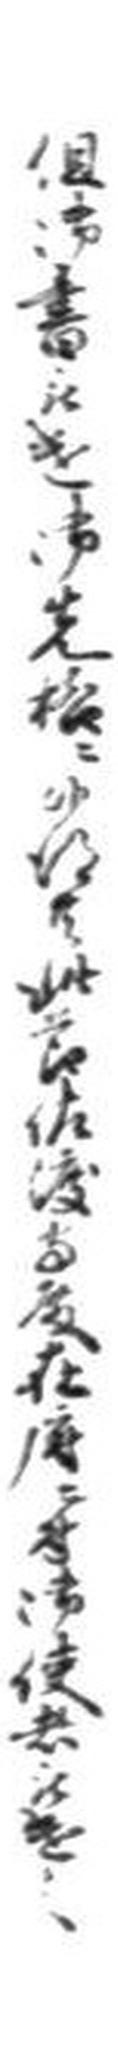但御書被遣御先様ニ候得共此節佐渡守殿在府ニ付御使者被遣之
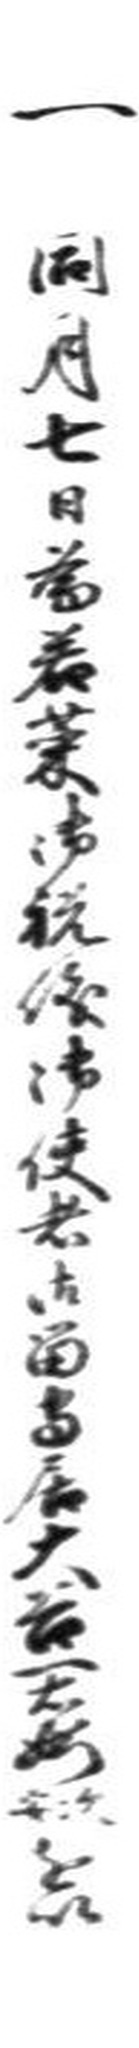一同月七日為若菜御祝儀御使者御留守居大谷一右衛門次安を以
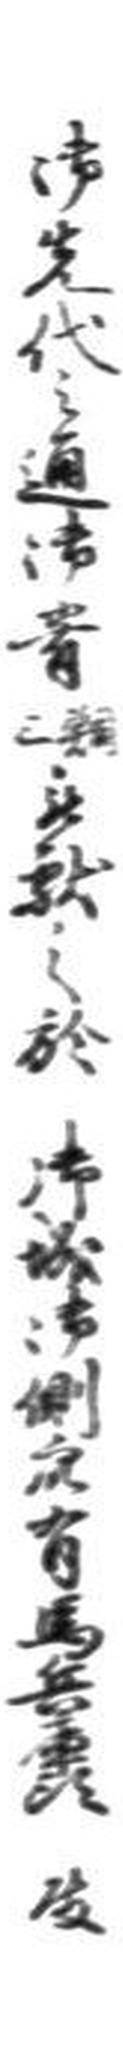御先代之通御肴鯛三被献之於御城御側衆有馬兵庫頭殿
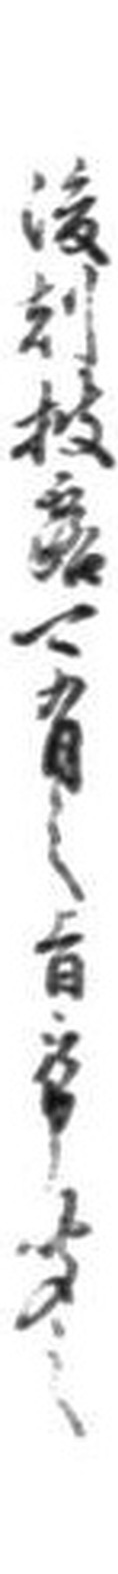後刻披露可有之旨被申聞之
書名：家譜 三十九 宗矩公 享保十年
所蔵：福井県文書館 Fukui Prefectural Archives
